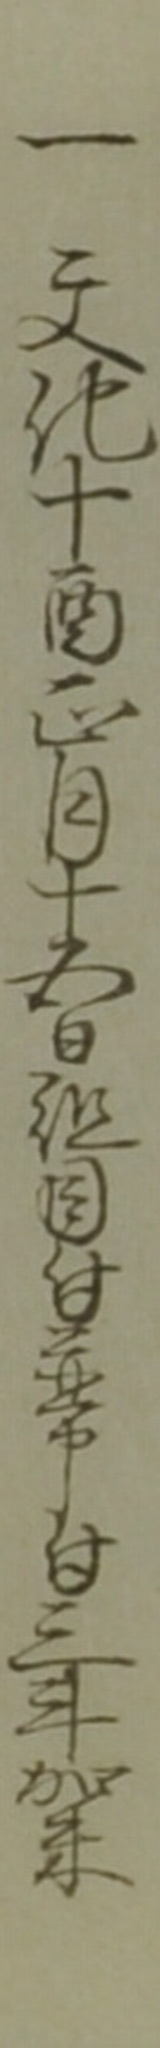一文化十酉正月十五日組目付並申付三斗加米
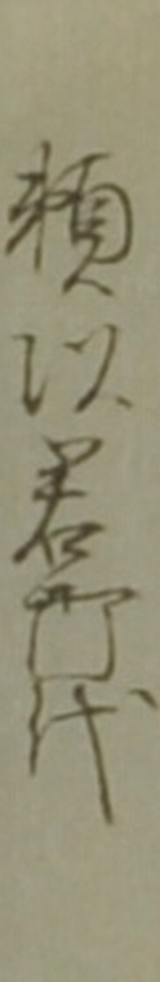頼以君御代
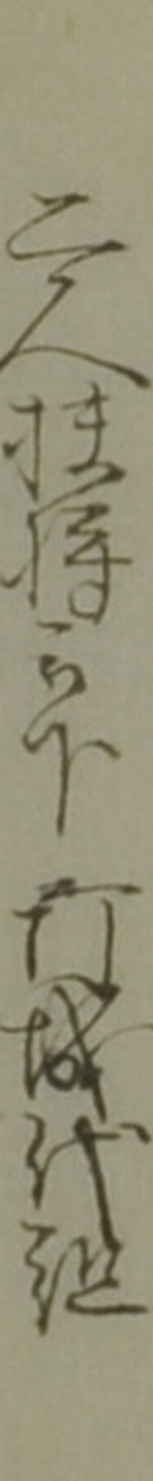二人扶持被下之御城代組
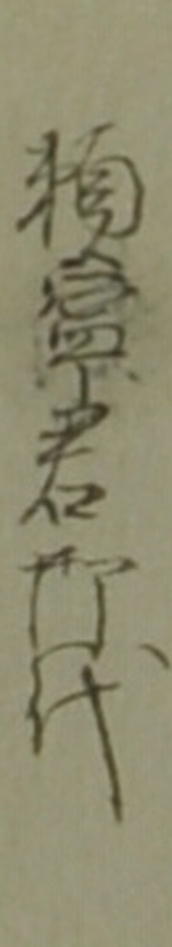頼以君御代
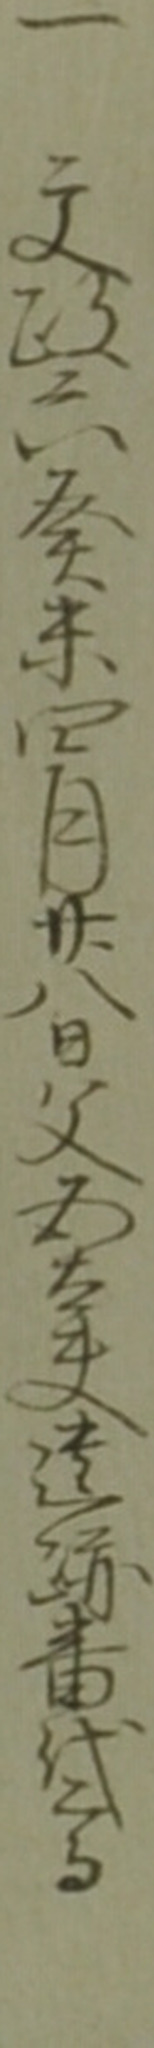一文政六癸未四月廿八日父五太夫遺跡番代高
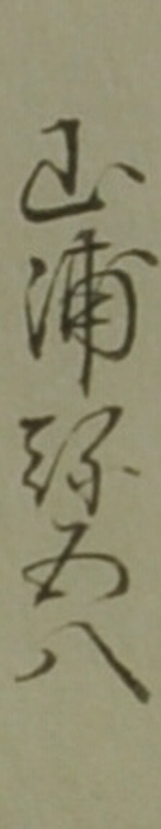山浦弥五八
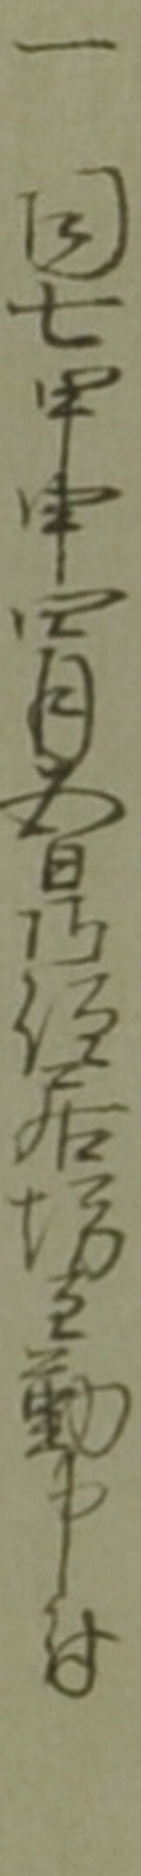一同七甲申四月五日御住居坊主勤申付
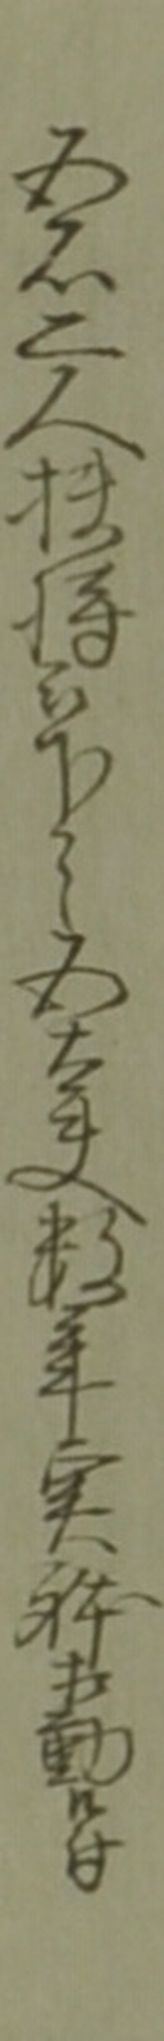五石二人扶持被下之五太夫数年実躰相勤候付
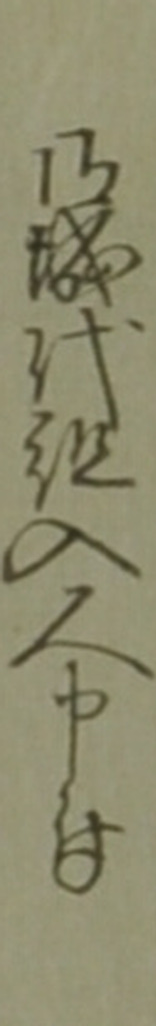御城代組入人申付
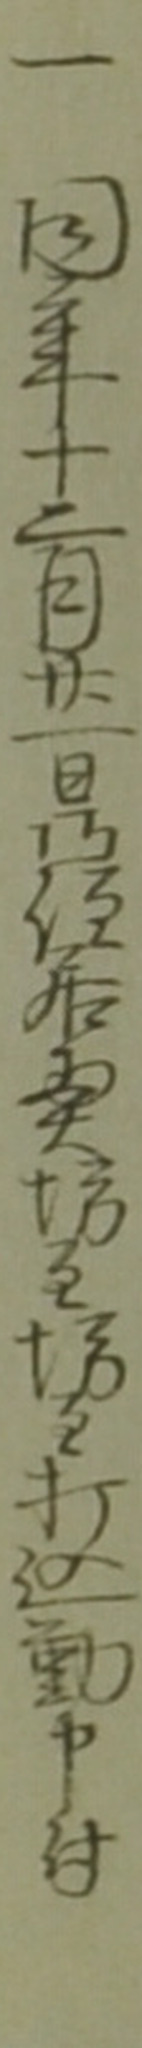一同年十二月廿一日御住居奥坊主坊主打込勤申付
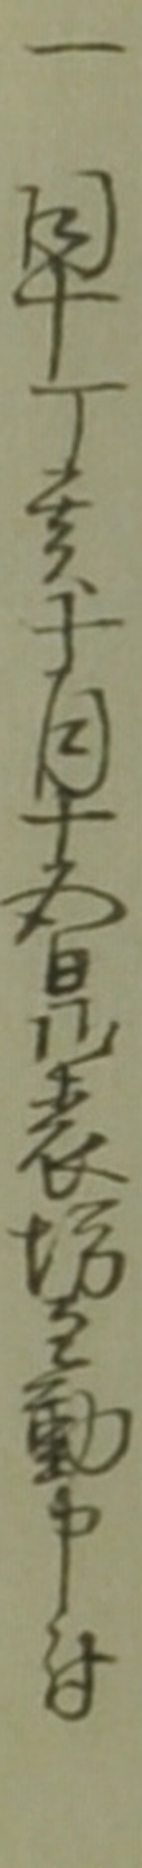一同十丁亥十月十五日御表坊主勤申付
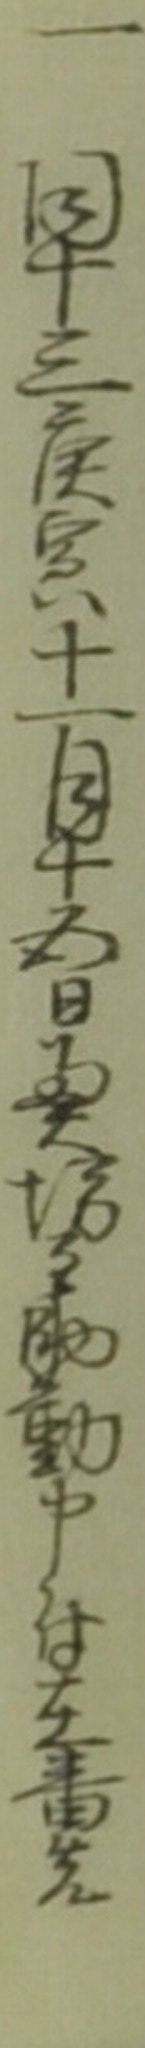一同十三庚寅十一月十五日奥坊主助勤申付在番先

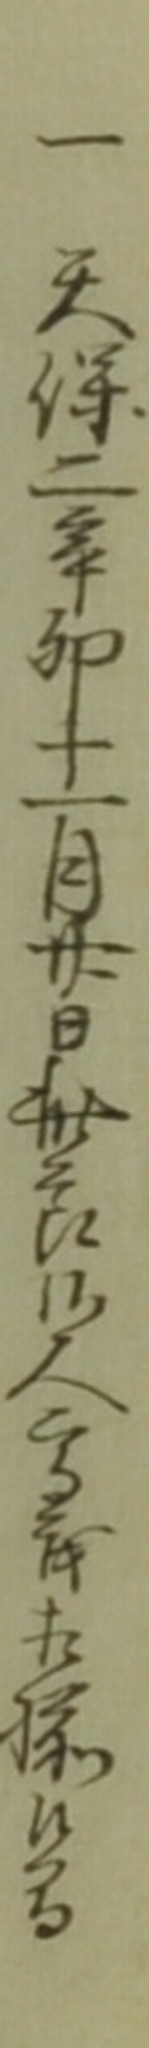一天保二辛卯十一月廿日此節御人高茂相揃候間
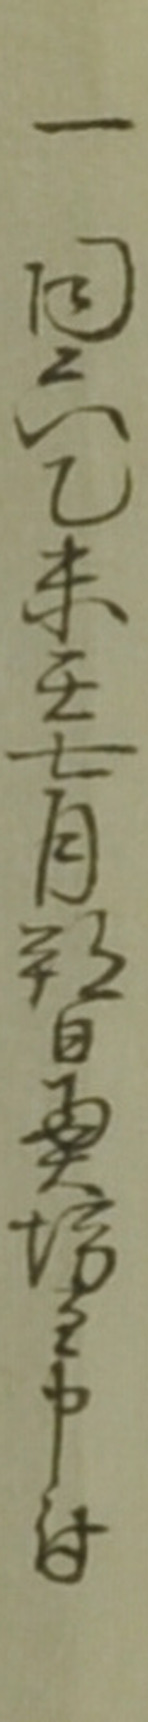一同六乙未閏七月朔日奥坊主申付
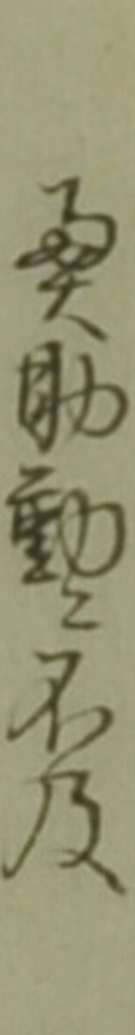奥助勤ニ不及
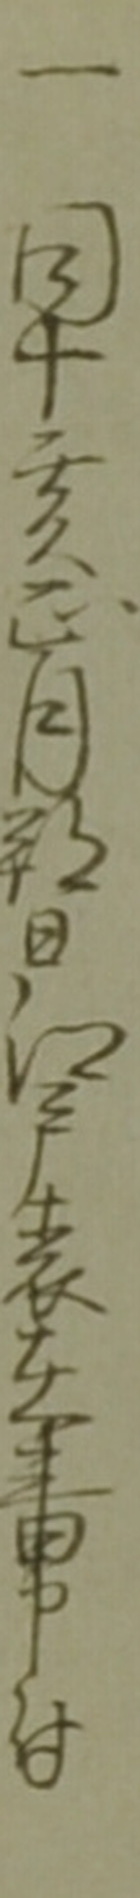一同十亥正月朔日江戸表在番申付
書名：無足諸士勤仕録（八）
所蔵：伊那市立高遠町図書館・合同会社AMANE
